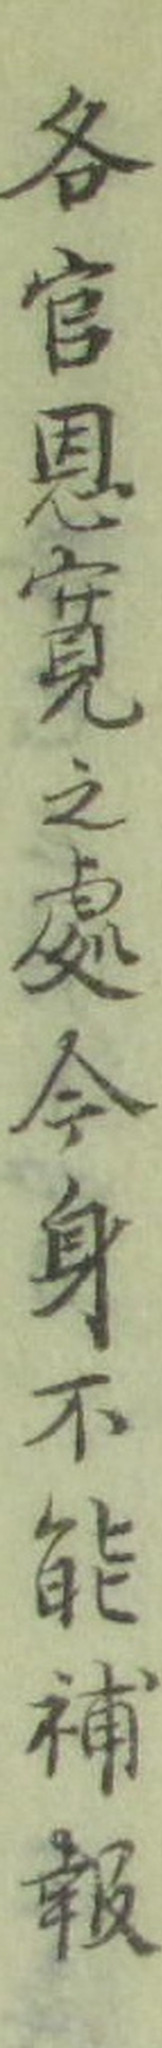各官恩寛之処今身不能補報
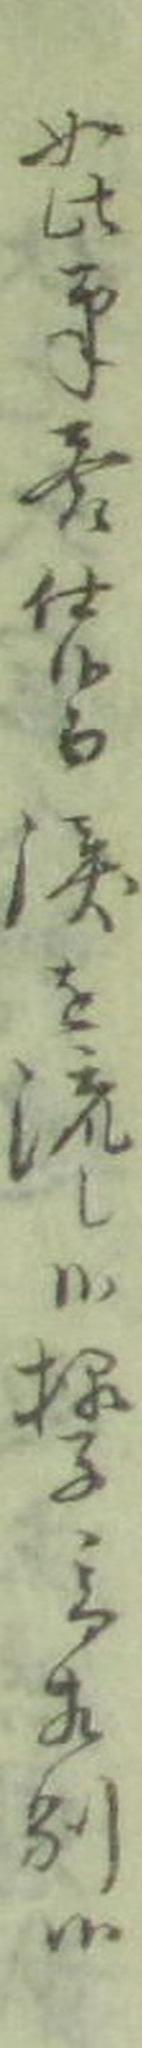如此筆答仕候而涙を流し候様子に而相別候
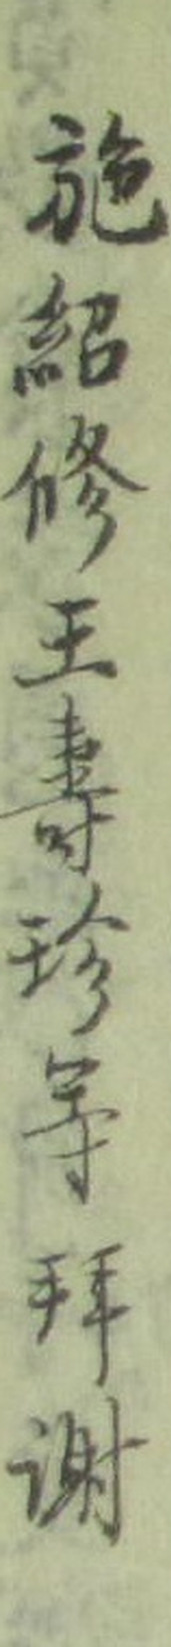施紹修王寿珍等拝謝
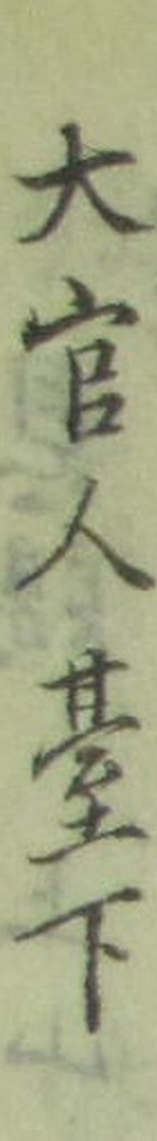大官人台下

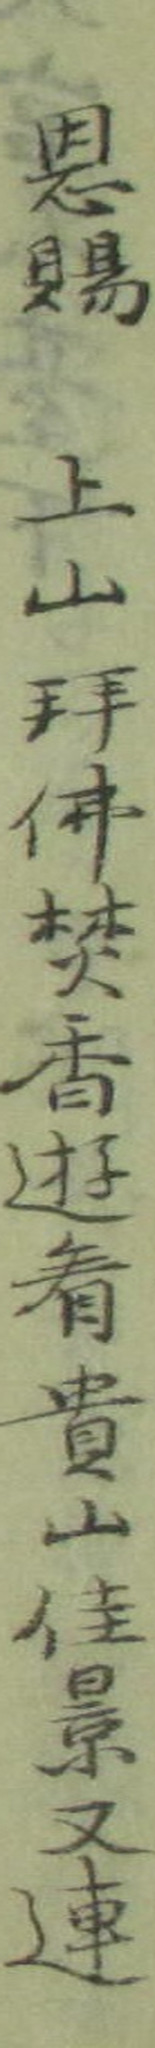恩賜上山拝仏焚香遊看貴山佳景又連
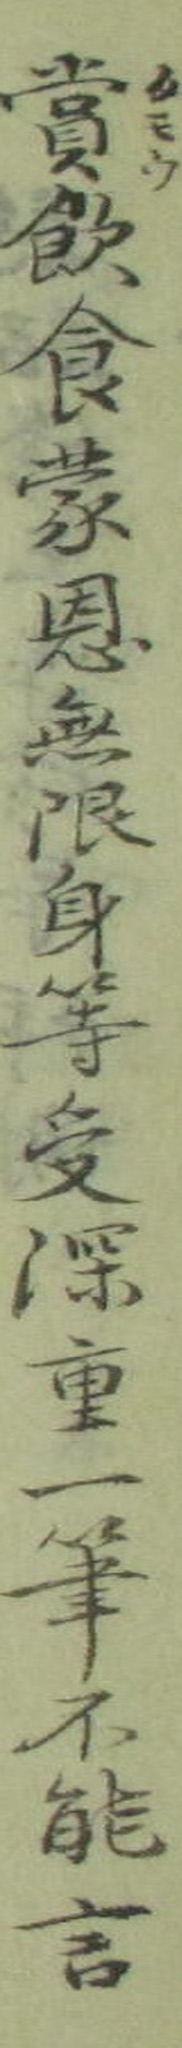賞飲食蒙恩無限身等受深重一筆不能言
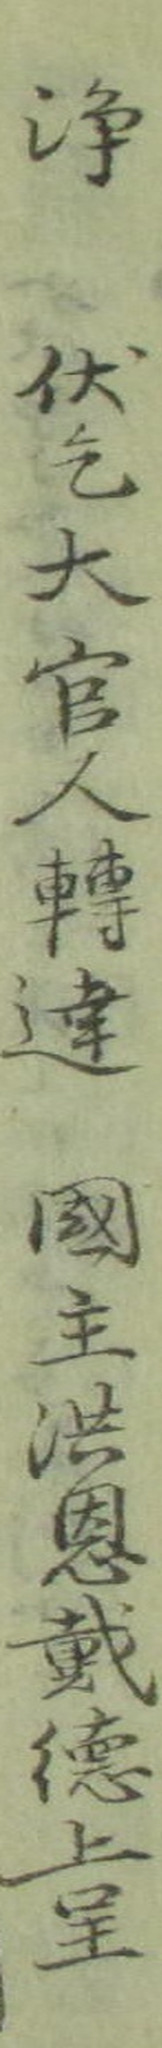浄伏乞大官人転達国主洪恩戴徳上呈
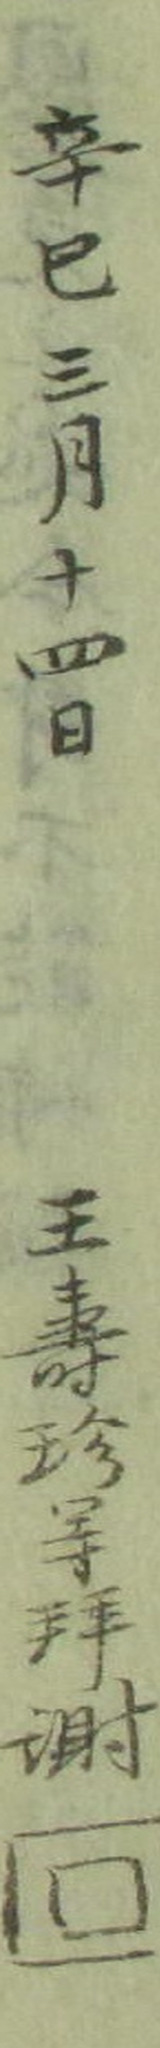辛巳三月十四日王寿珍等拝謝⧈
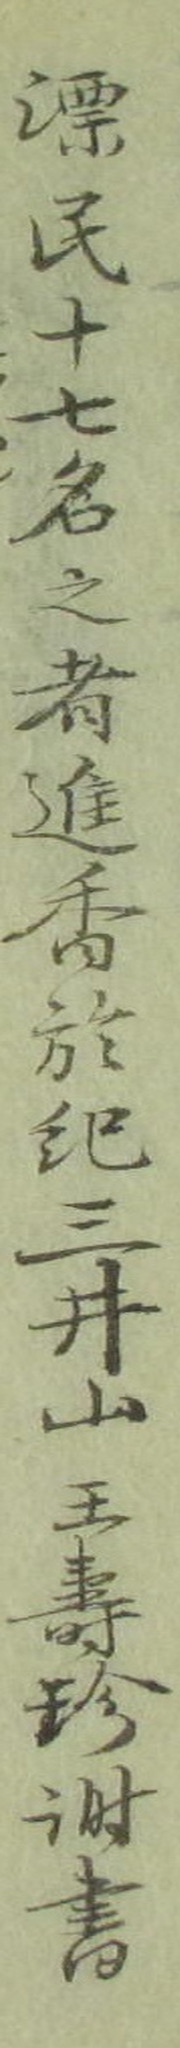漂民十七名之者進香於紀三井山王寿珍謝書
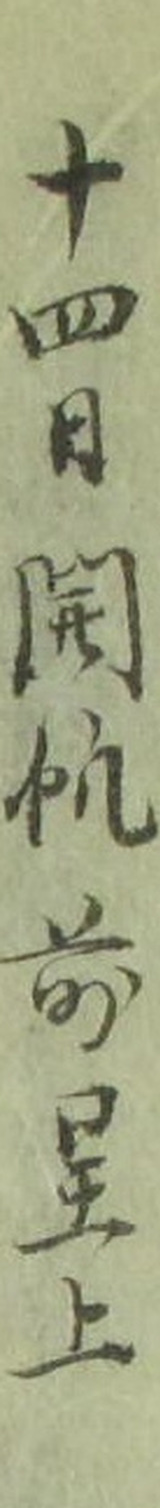十四日開帆前呈上
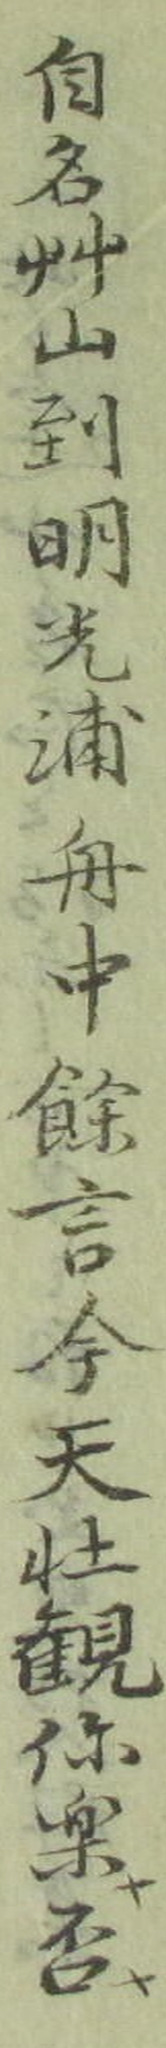自名艸山到明光浦舟中余言今天壮観你楽否
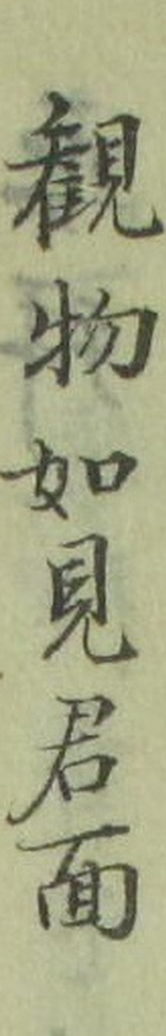観物如見君面王
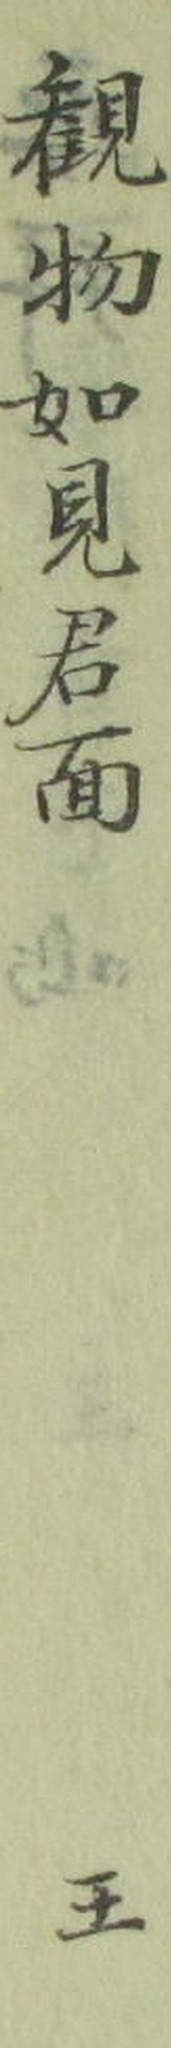観物如見君面王
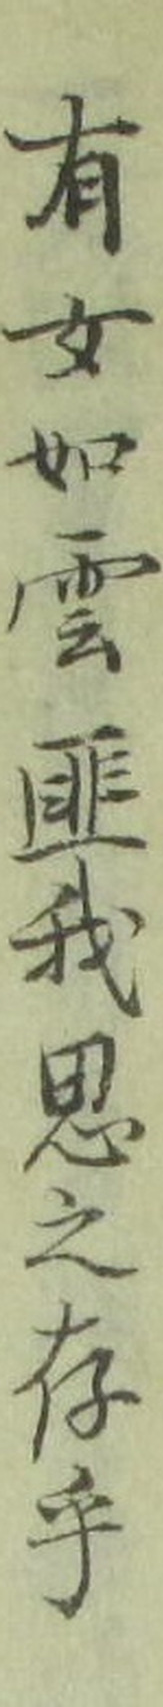有女如雲匪我思之存乎鳴
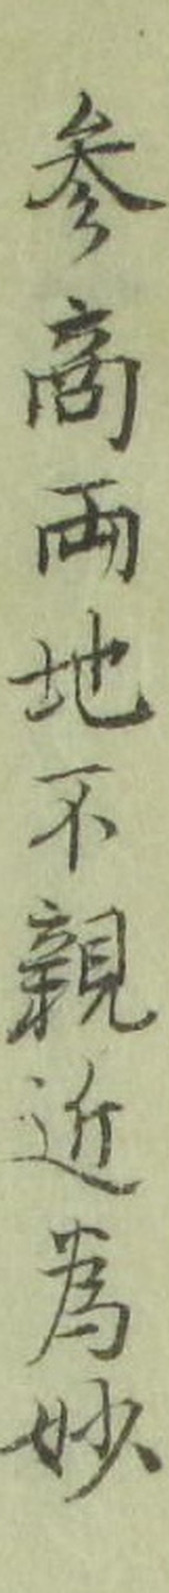参商両地不親近為妙王
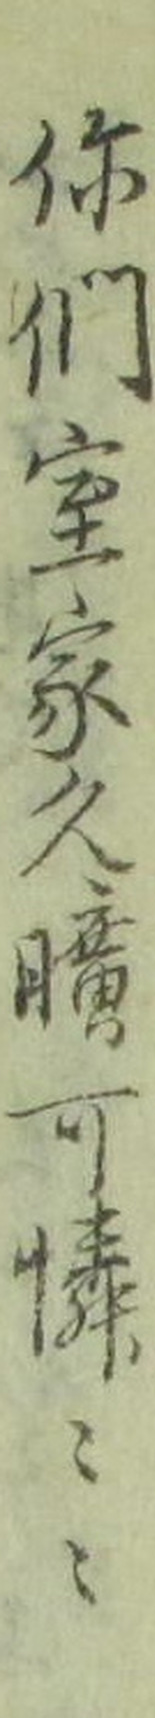你們室家久曠可憐々々鳴
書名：紀州九木浦庄屋記録 四
